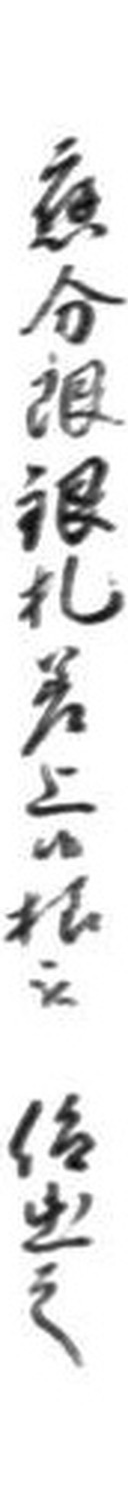応分限銀札差上候様被仰出之
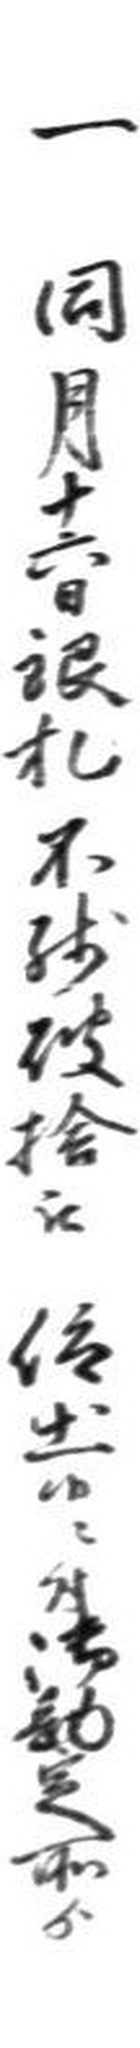一同月十六日銀札不残破捨被仰出候ニ付御勘定所ゟ

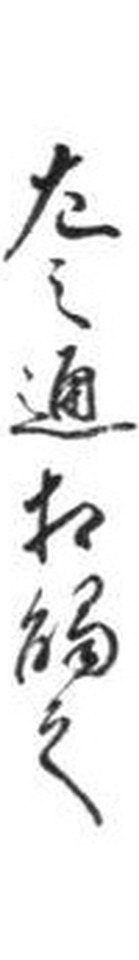左之通相触之
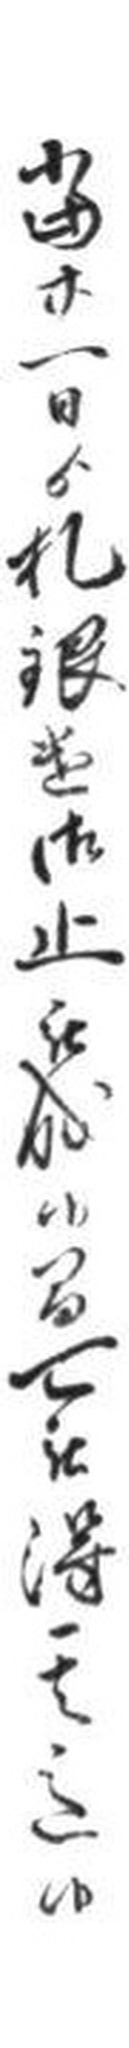當廿一日ゟ札銀遣御止被成候間可被得其意候
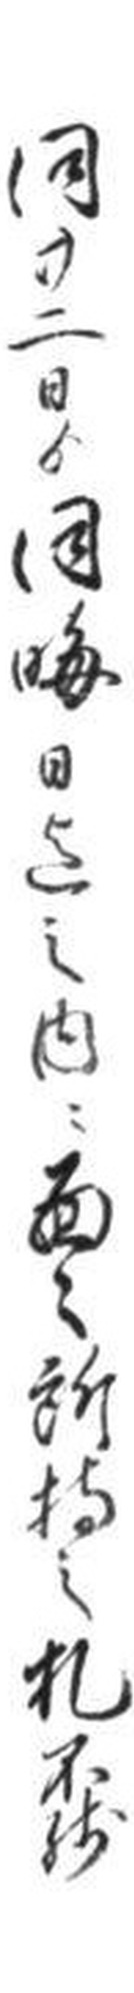同廿二日ゟ同晦日迄之内二面々所持之札不残
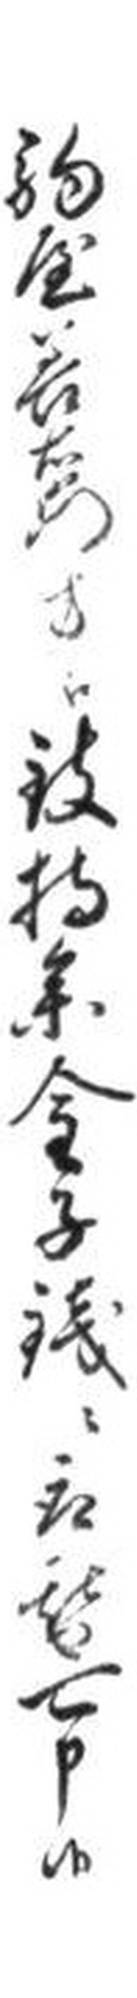駒屋善左衛門方江致持参金子銭ニ被替可申候
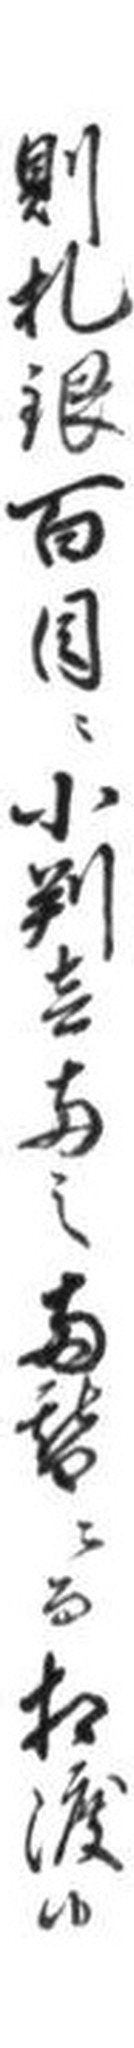則札銀百目ニ小判壱両之両替ニ而相渡候
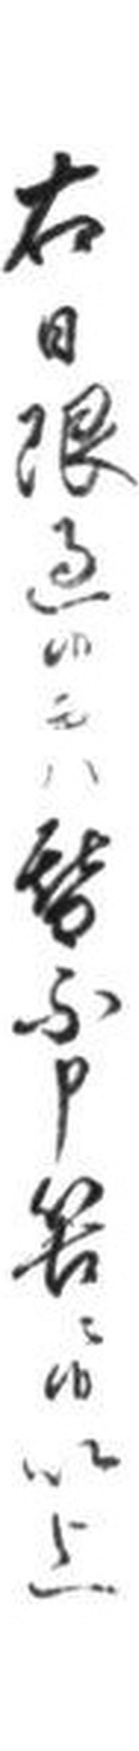右日限過候而ハ替不申筈ニ候以上
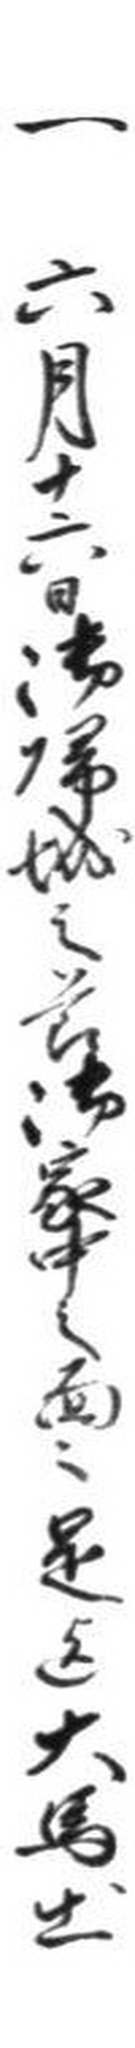一六月十六日御帰城之節御家中之面々是迄大馬出
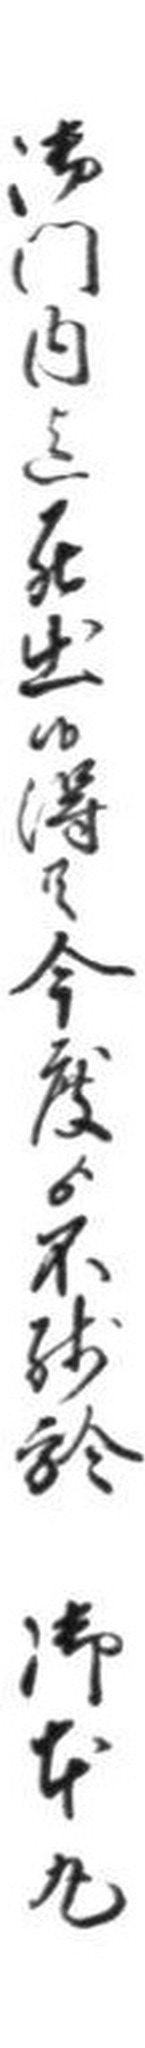御門内迄罷出候得共今度ゟ不残於御本丸
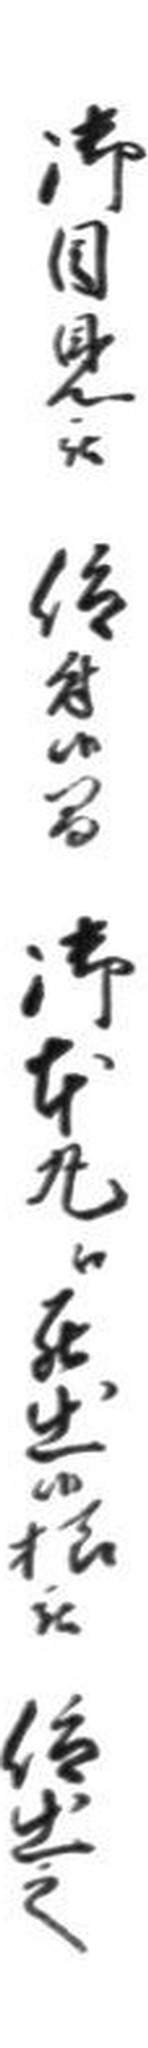御目見被仰付候間御本丸江罷出候様被仰出之
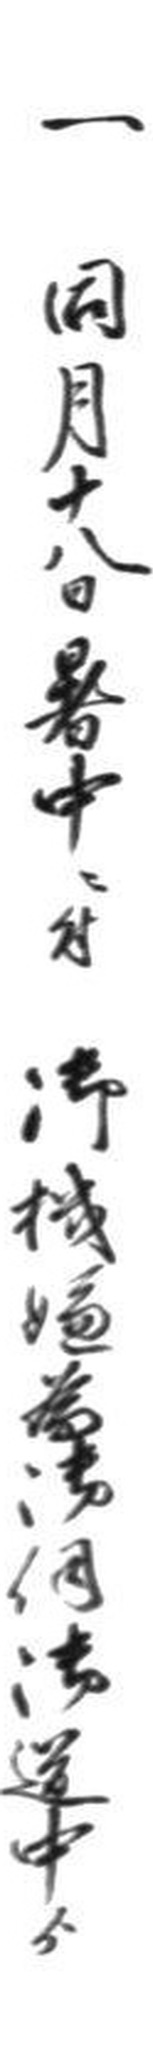一同月十八日暑中ニ付御機嫌為御伺御道中ゟ
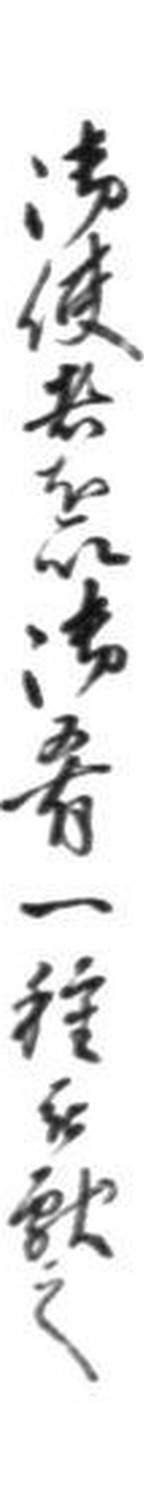御使者を以御肴一種被献之
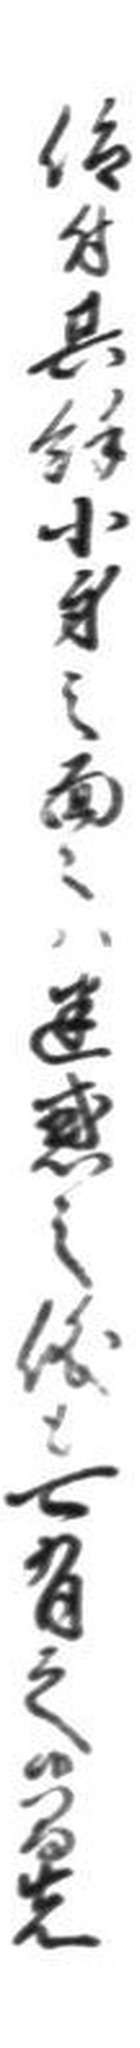仰付其餘小身之面々ハ迷惑之儀も可有之候間先
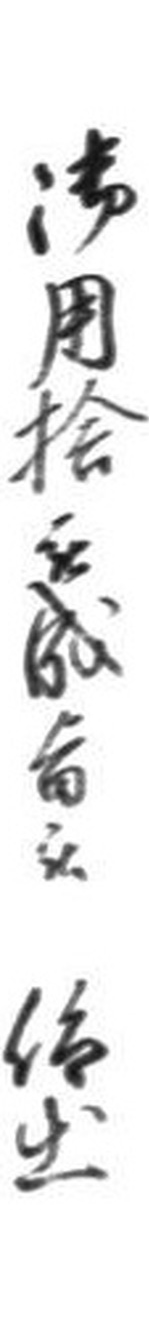御用捨被成旨被仰出
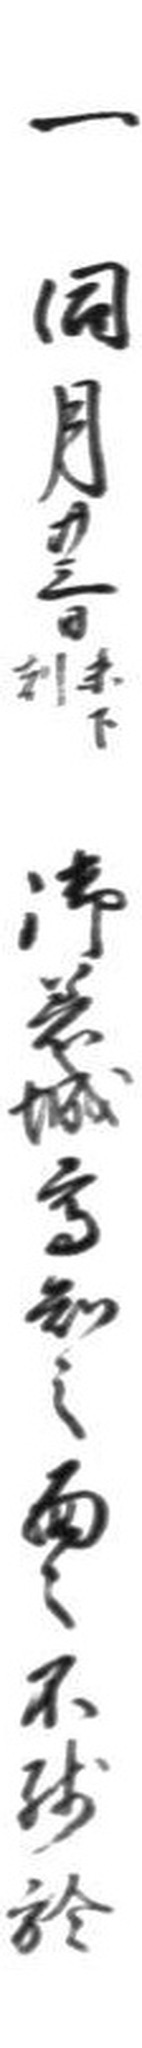一同月廿三日未下刻御着城高知之面々不残於
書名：家譜 十六 吉品公 従貞享三年閏三月到同四年
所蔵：福井県文書館 Fukui Prefectural Archives
